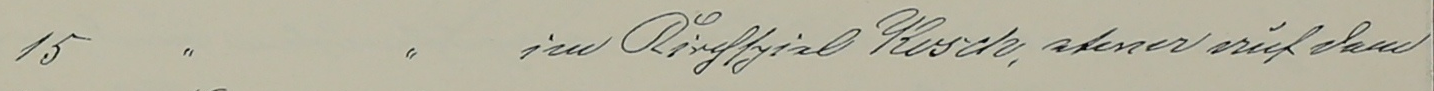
15 " " im Kirchspiel Kosch, etwa auf dem
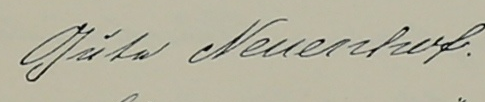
Gute Neuenhof.
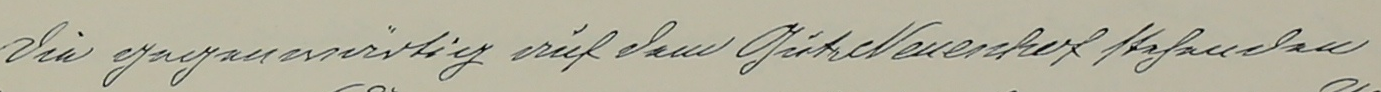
Die gegenwärtig auf dem Gute Neuenhof stehenden
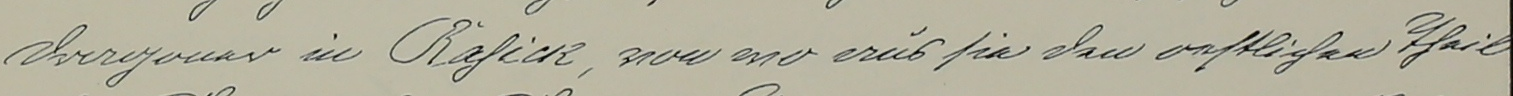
Dragoner in Rasick, von wo aus sie den oestlichen Theil
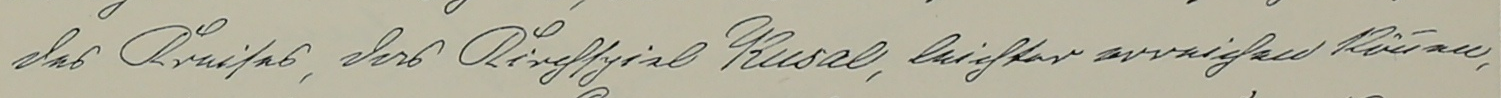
des Kreises, das Kirchspiel Kusal, leichter erreichen können,
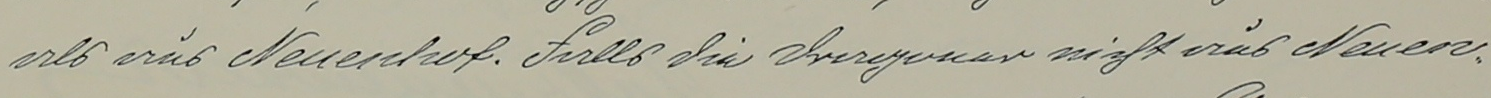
als aus Neuenhof. Falls die Dragoner nicht aus Neuen-
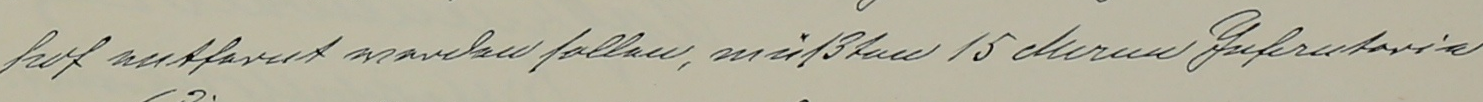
hof entfernt werden sollen, müßten 15 Mann Infanterie
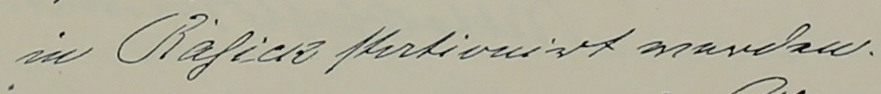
in Rasick stationirt werden.
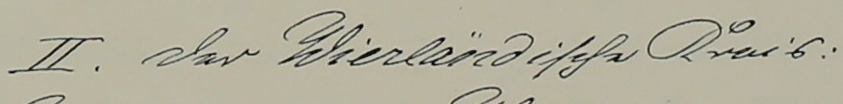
II. Der Wierländische Kreis:
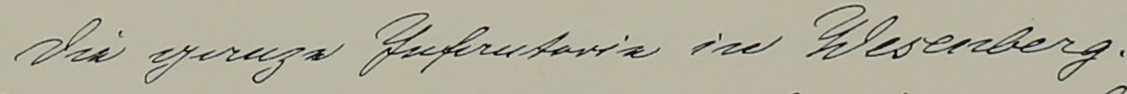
Die ganze Infanterie in Wesenberg.
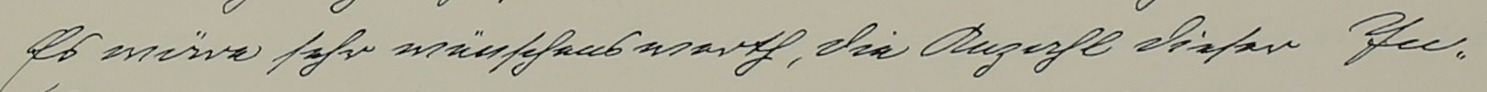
Es wäre sehr wünschenswerth, die Anzahl dieser In-
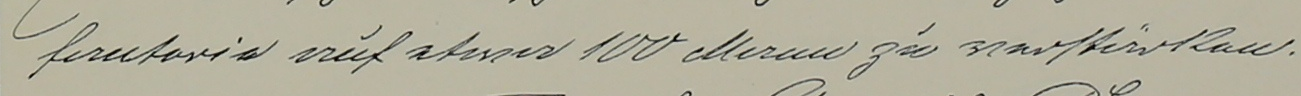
fanterie auf etwa 100 Mann zu verstärken.
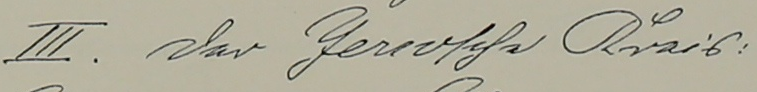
III. Der Jerwsche Kreis:
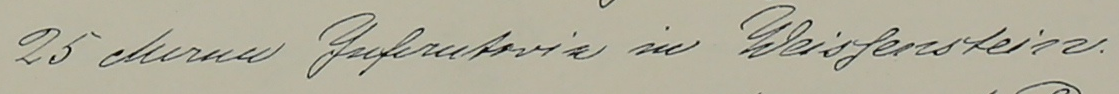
25 Mann Infanterie in Weissenstein.
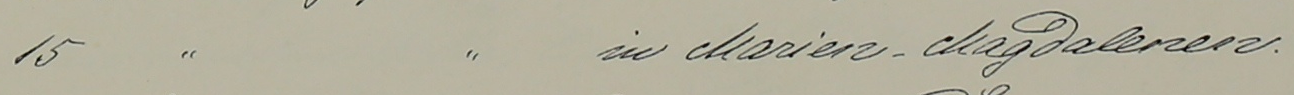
15 " " in Marien-Magdalenen.
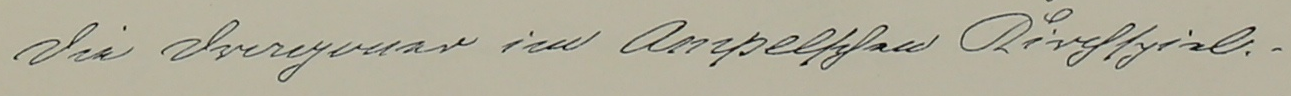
Die Dragoner im Ampelschen Kirchspiel.
